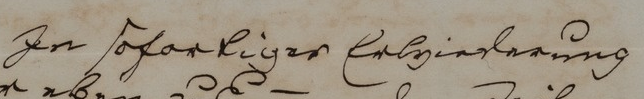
In sofortiger Erwiederung
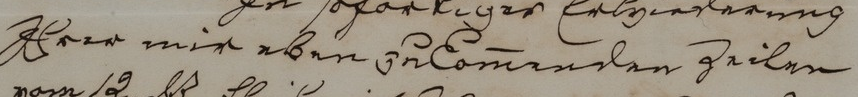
Ihrer mir eben zukommenden Zeilen
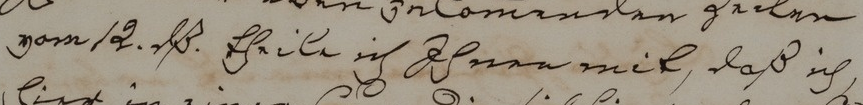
vom 12. dß. theile ich Ihnen mit, daß ich,
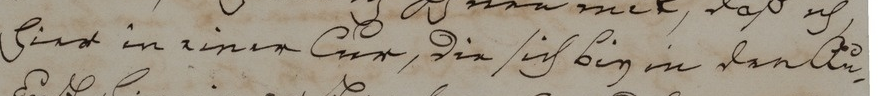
hier in einer Cur, die sich bis in den Au-
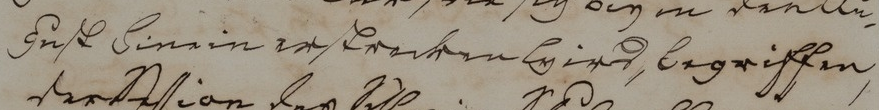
gust hinein erstrecken wird, begriffen,
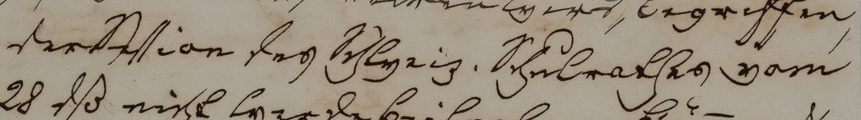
der Session des Schweiz. Schulrathes vom
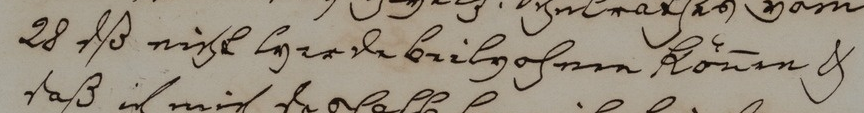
28 dß nicht werde beiwohnen können &
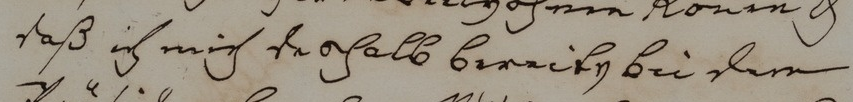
daß ich mich deshalb bereits bei dem
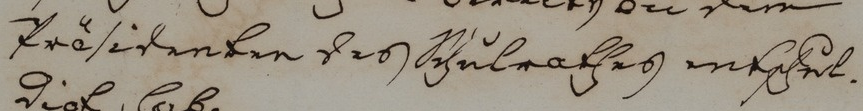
Präsidenten des Schulrathes entschul-
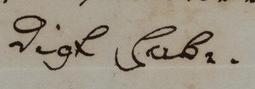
digt habe.
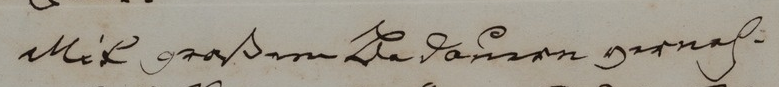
Mit großem Bedauern verneh-
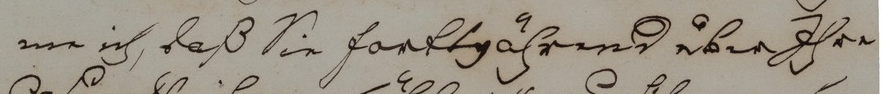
me ich, daß Sie fortwährend über Ihre
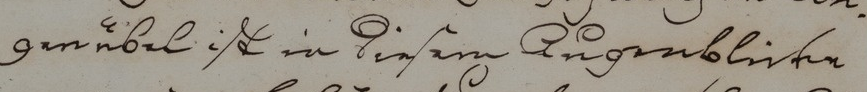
genübel ist in diesem Augenblicke
